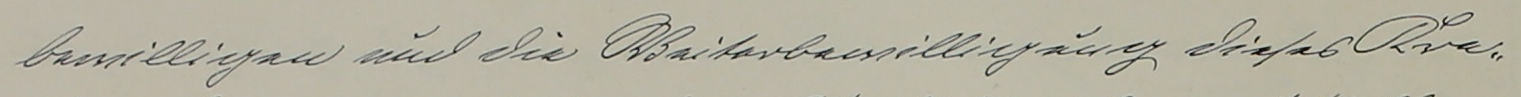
bewilligen und die Weiterbewilligung dieses Kre-
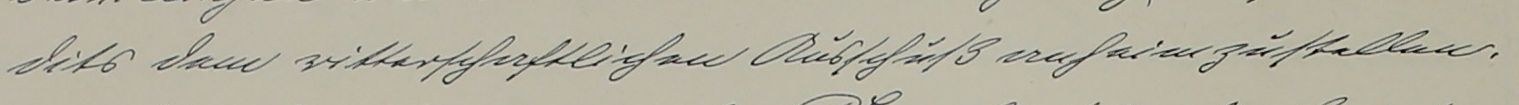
dits dem ritterschaftlichen Ausschuß anheimzustellen.
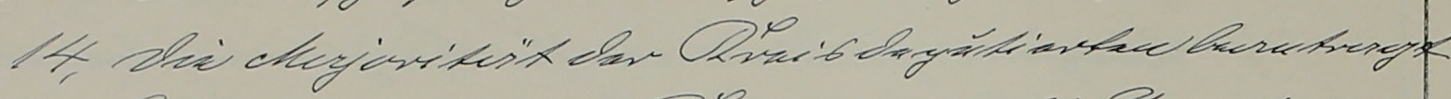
14. Die Majorität der Kreisdeputierten beantragt
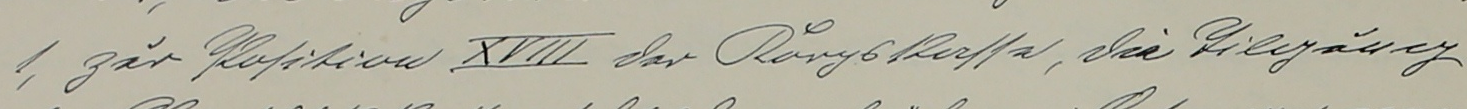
1. zur Position XVIII der Korpskasse, die Tilgung
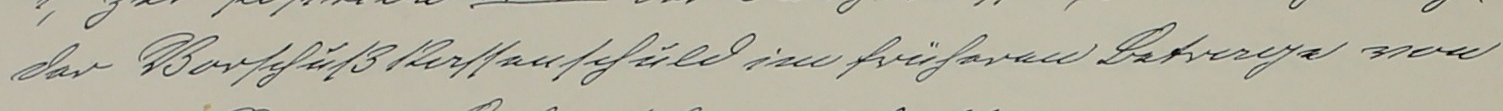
der Vorschußkassenschuld im früheren Betrage von
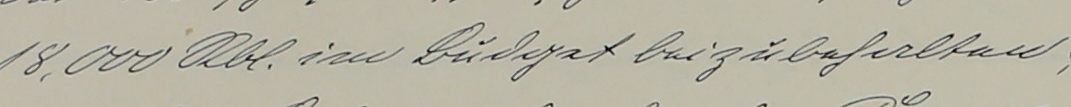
18.000 Rbl. im Budget beizubehalten;
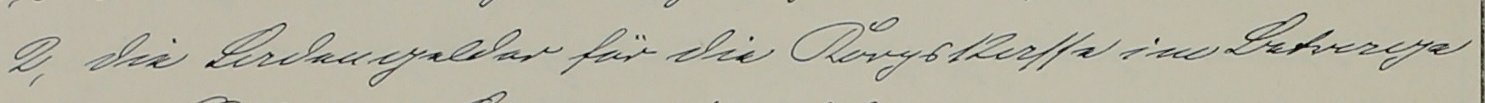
2. die Ladengelder für die Korpskasse im Betrage
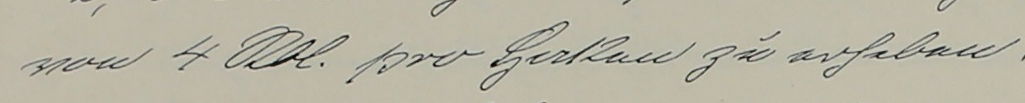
von 4 Rbl. pro Haken zu erheben.
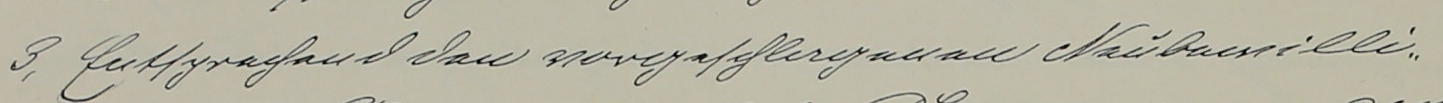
3. Entsprechend den vorgeschlagenen Neubewilli-
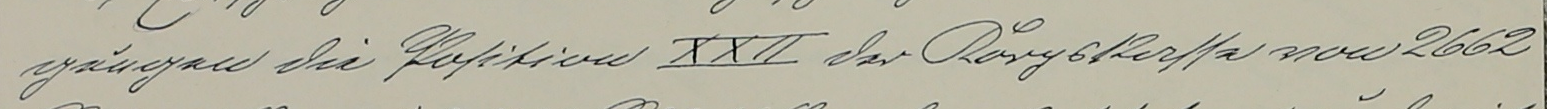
gungen die Position XXII der Korpskasse von 2662
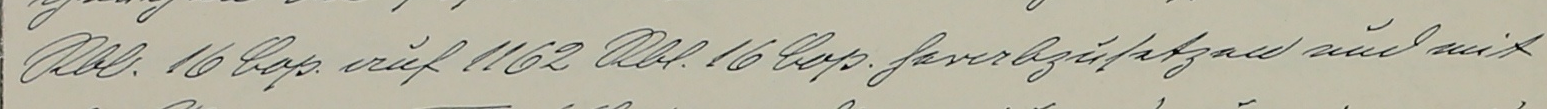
Rbl. 16 Kop. auf 1162 Rbl. 16 Kop. herabzusetzen und mit
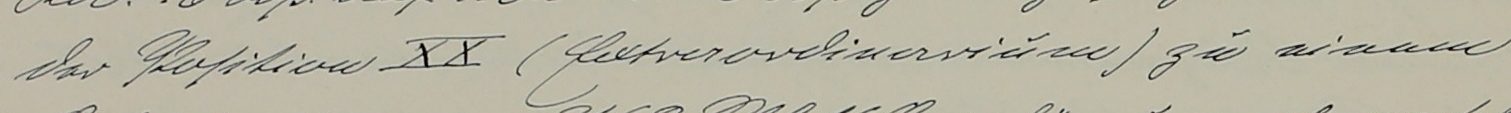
der Position XX (Extraordinarium) zu einem
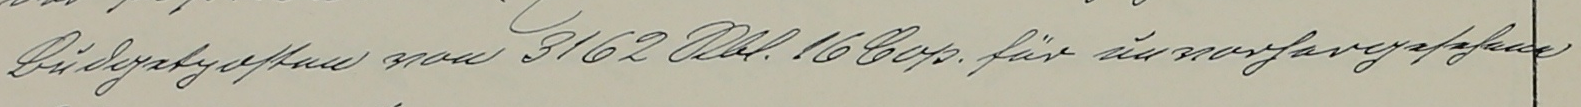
Budgetposten von 3162 Rbl. 16 Kop. für unvorhergesehene
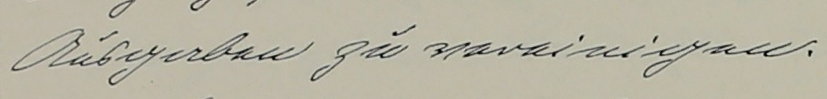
Ausgaben zu vereinigen.
